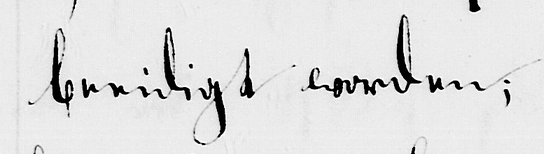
beeidigt worden;
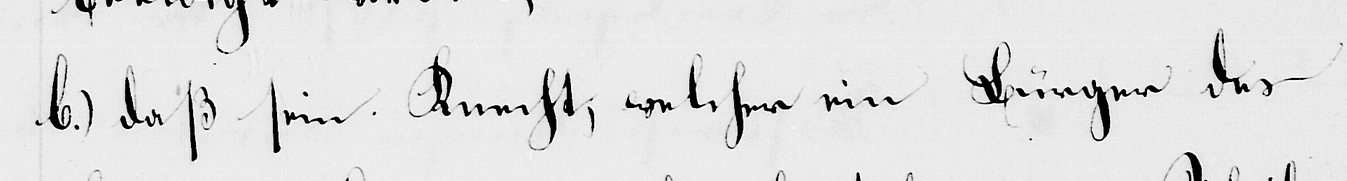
b.) daß sein Knecht, welcher ein Bürger des
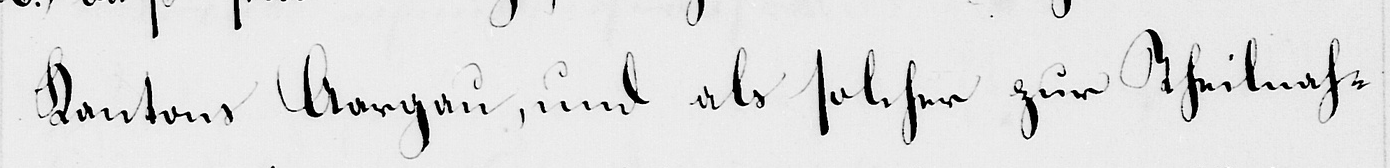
Kantons Aargau, und als solcher zur Theilnah¬
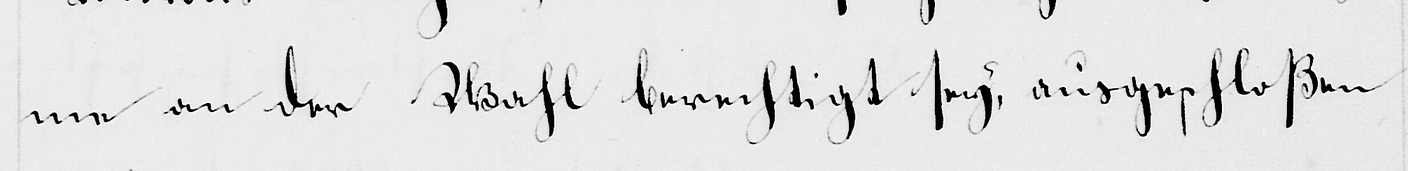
me an der Wahl berechtigt sey, ausgeschloßen
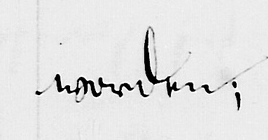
worden;
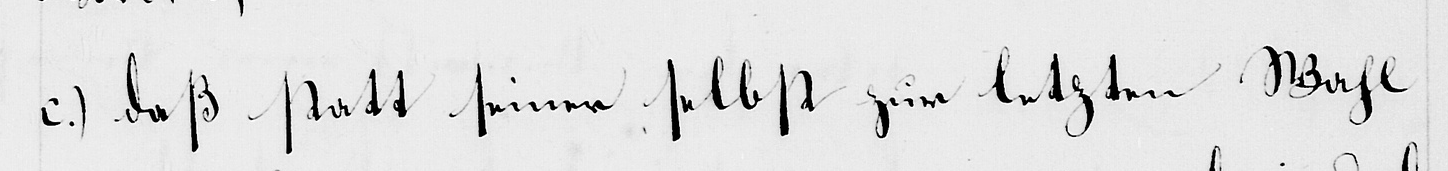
c.) daß statt seiner selbst zur letzten Wahl
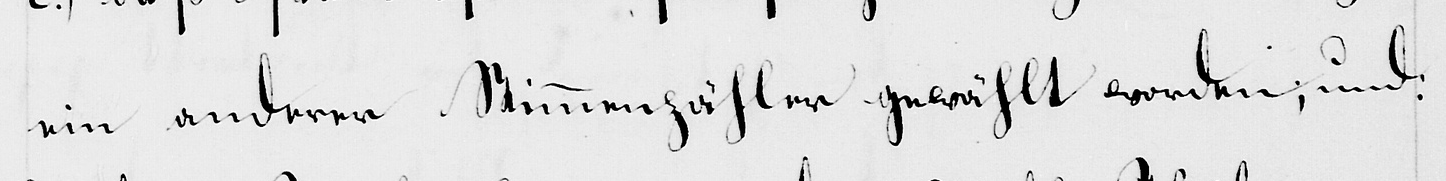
ein anderer Stimmenzähler gewählt worden; und:
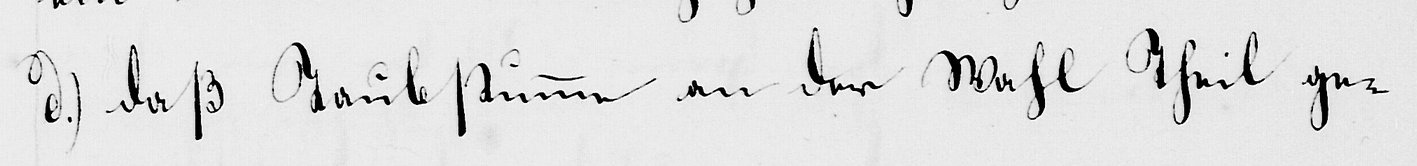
d.) daß Taubstumme an der Wahl Theil ge¬
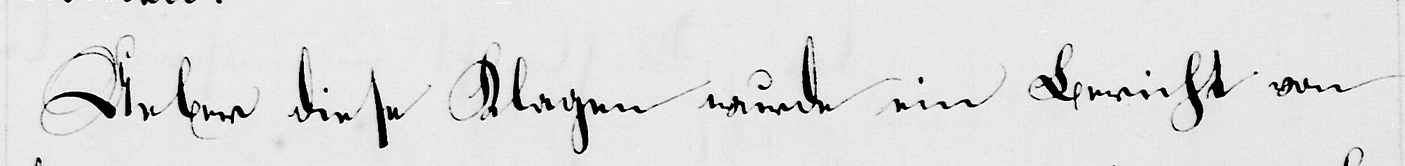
Ueber diese Klagen wurde ein Bericht von
